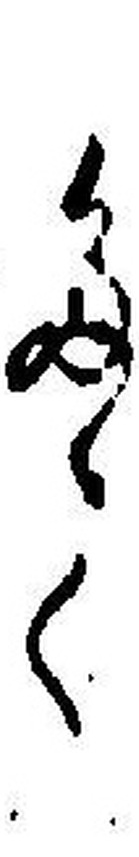たゝく
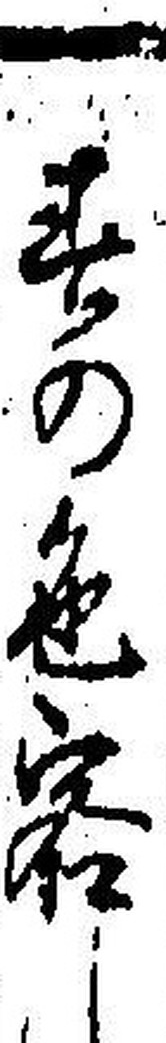春の色客
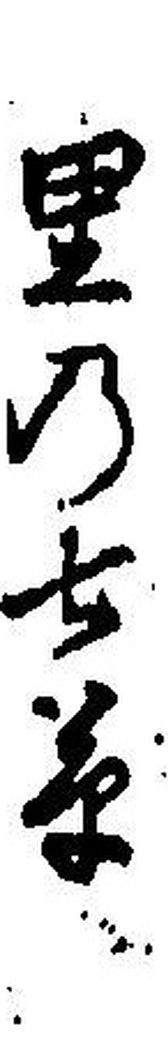里の七草
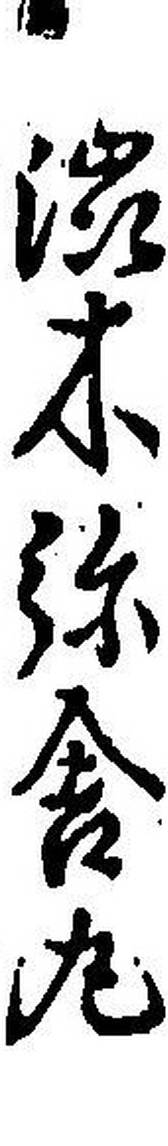渋木弥舎丸
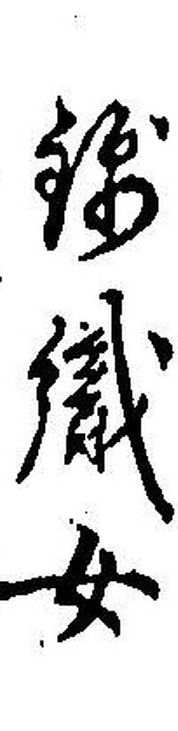錦織女
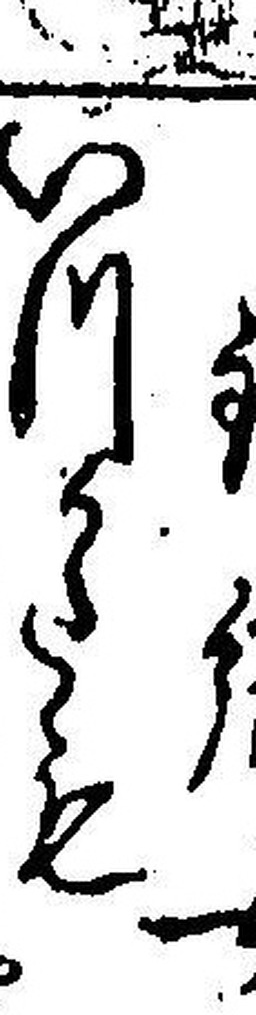いつかたも
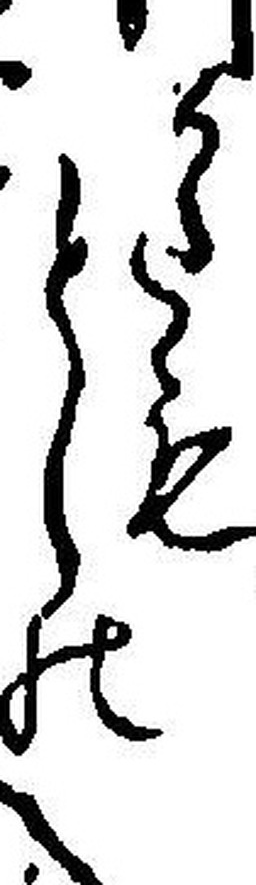としの
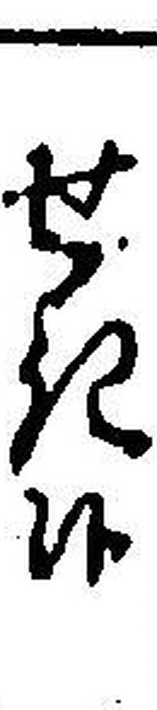せき候
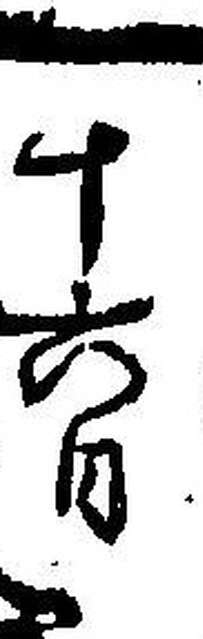十六日
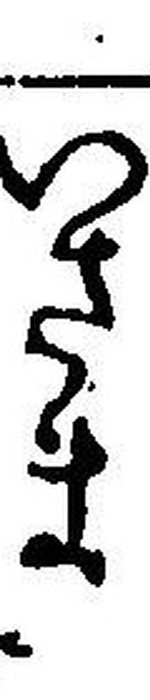いさま
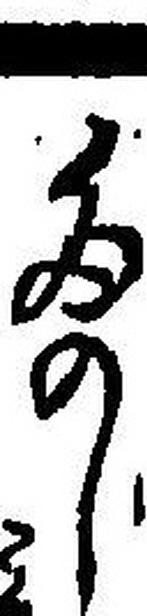たのし
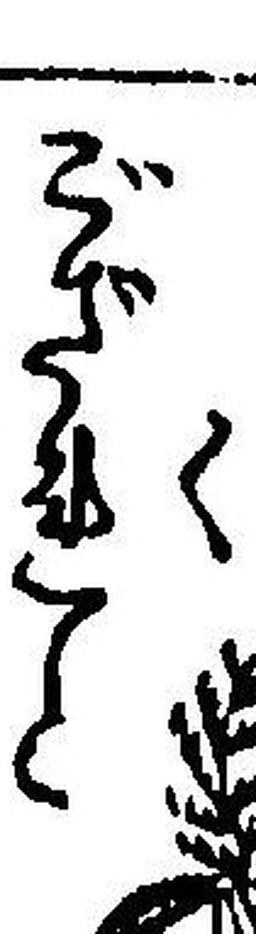ござれと
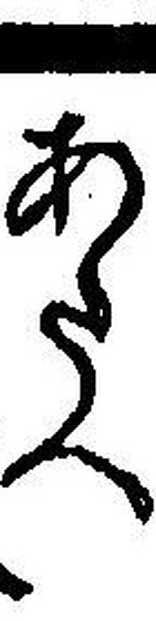あたへ
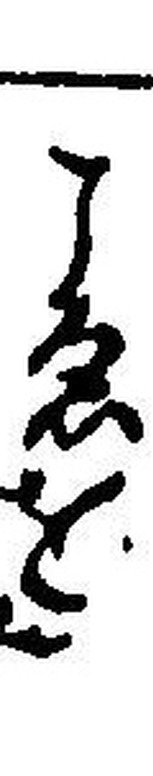こゑを
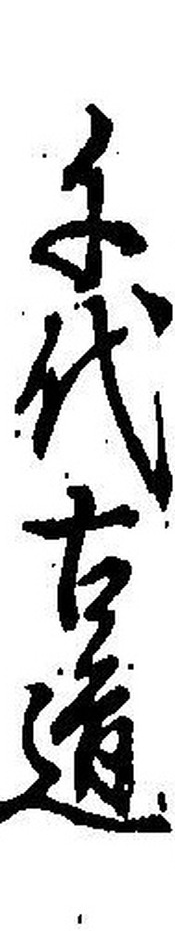千代古道
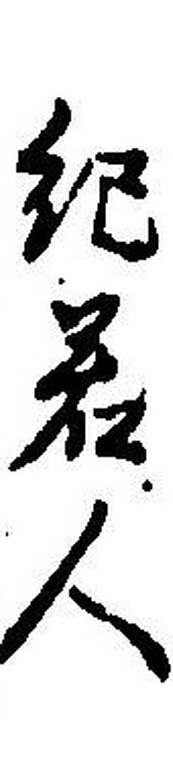紀若人
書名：どうれ百人一首 / 鹿都部真顔(狂歌堂)編
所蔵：東京大学総合図書館 General Library in the University of Tokyo, JAPAN
